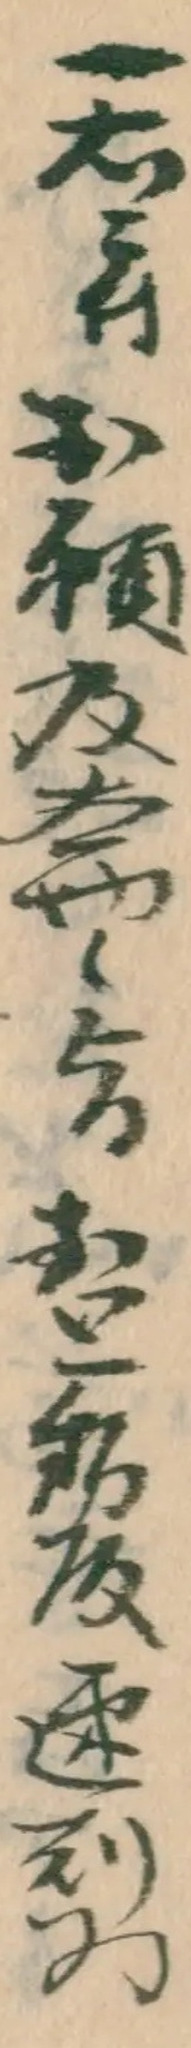一右ニ付お願及太切候旨おと勢殿速刻為
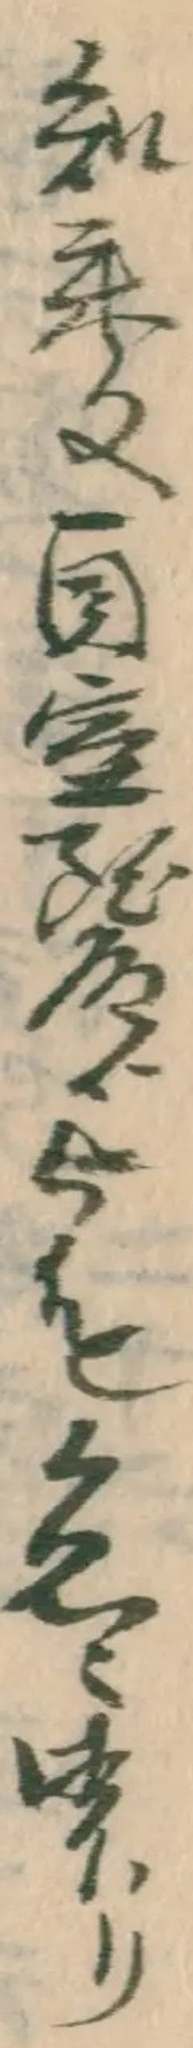知来又貞室院殿ゟ被達急ニ御下り
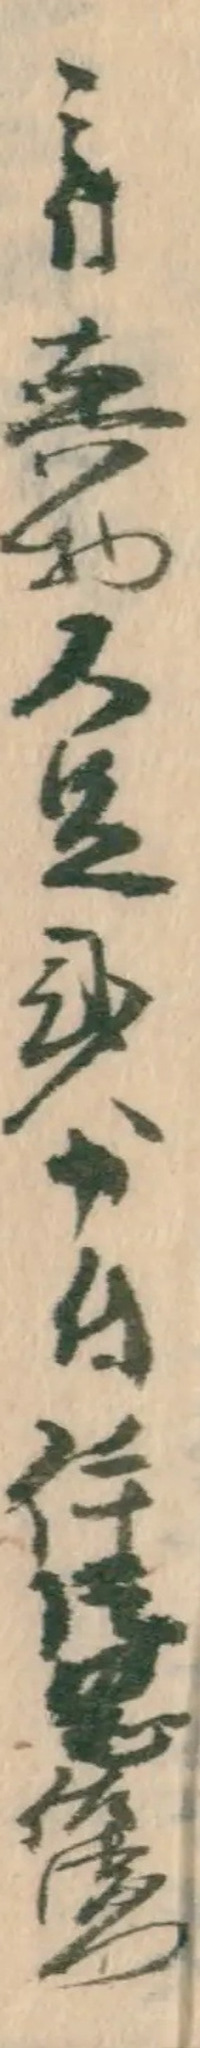ニ付輿物人足弐人申付件片岡佐右衛門
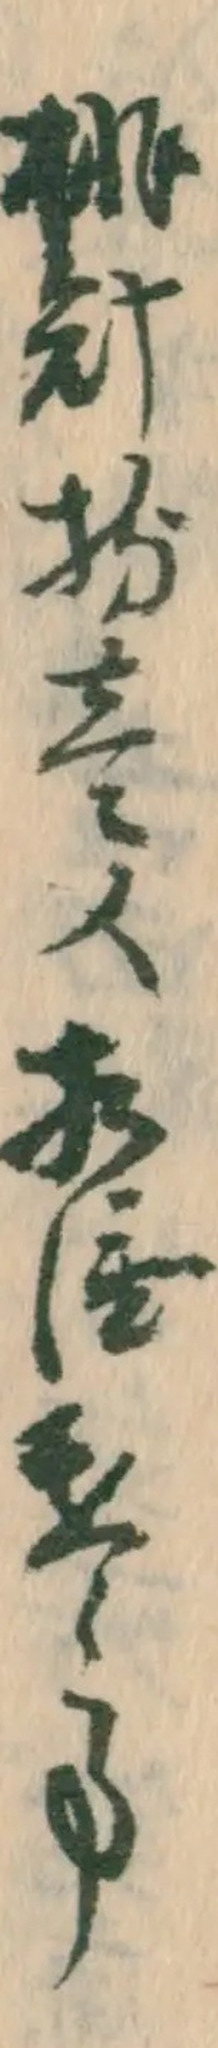挑灯持壱人相添遣候事
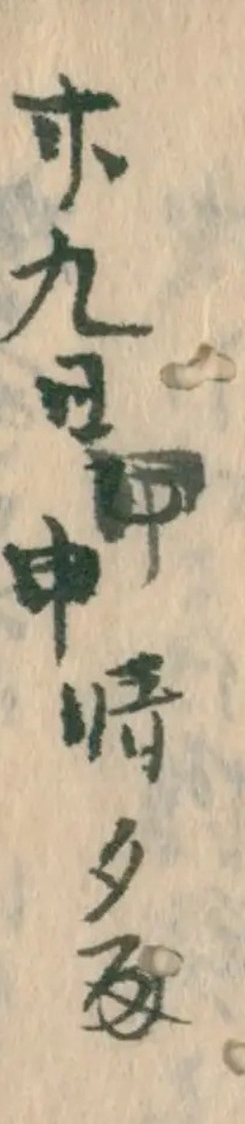廿九日甲申晴夕雨
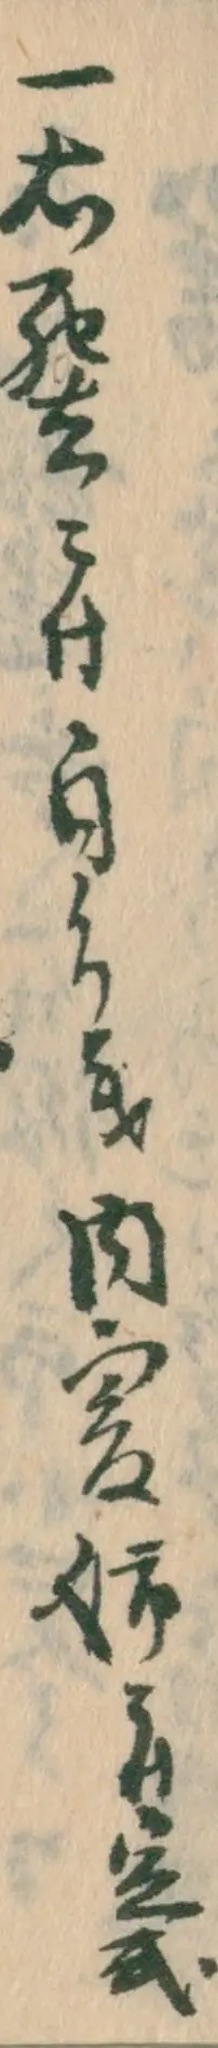一右死去ニ付自分義内爰姉ニ付定式
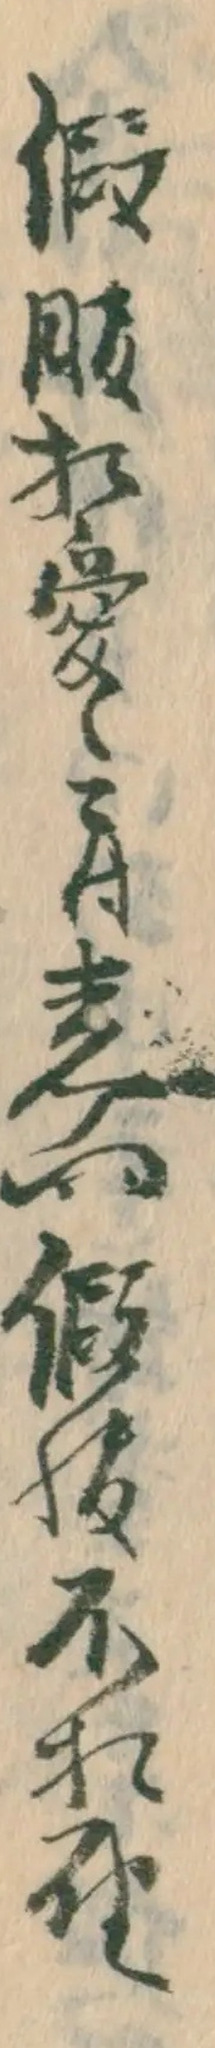仮服相受候ニ付差向仮服不相届
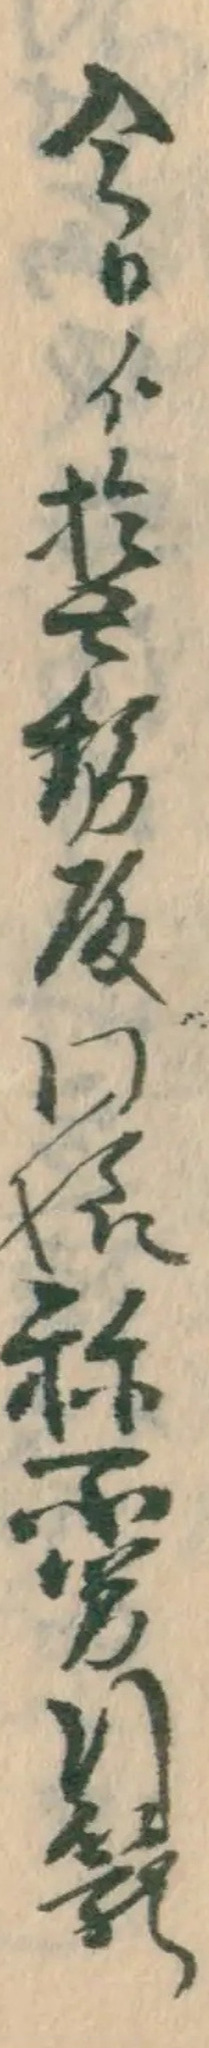今日ゟおと勢殿同様称所労引籠
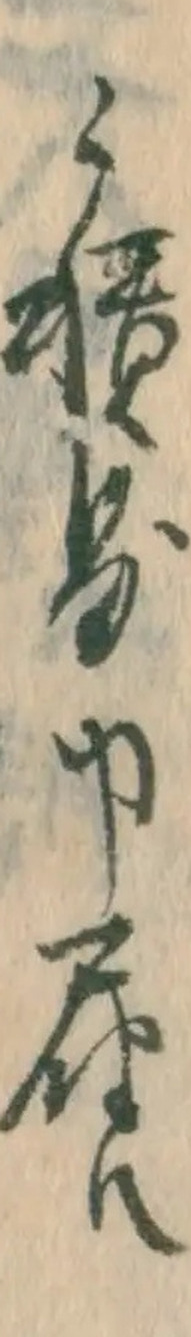候積即申届候

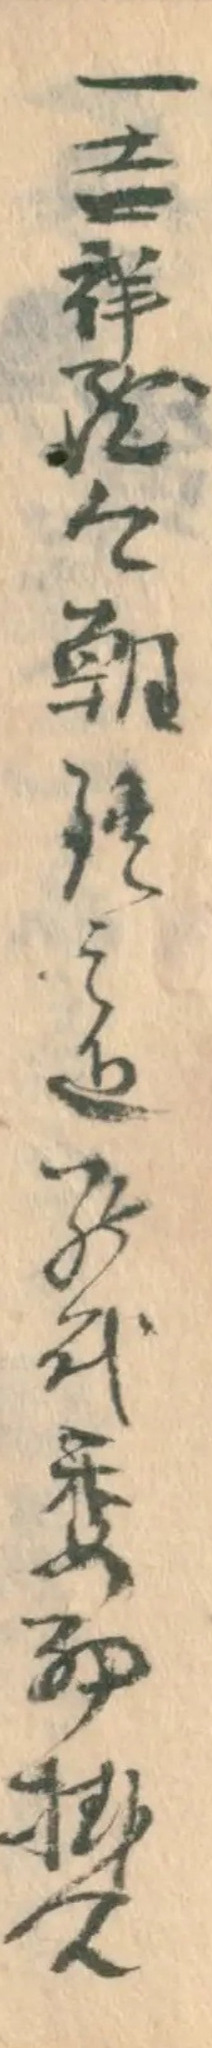一吉祥院今朝鐙之進罷越委細掛合
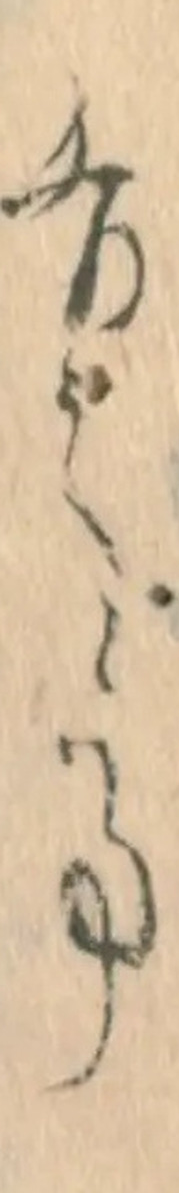有之候事
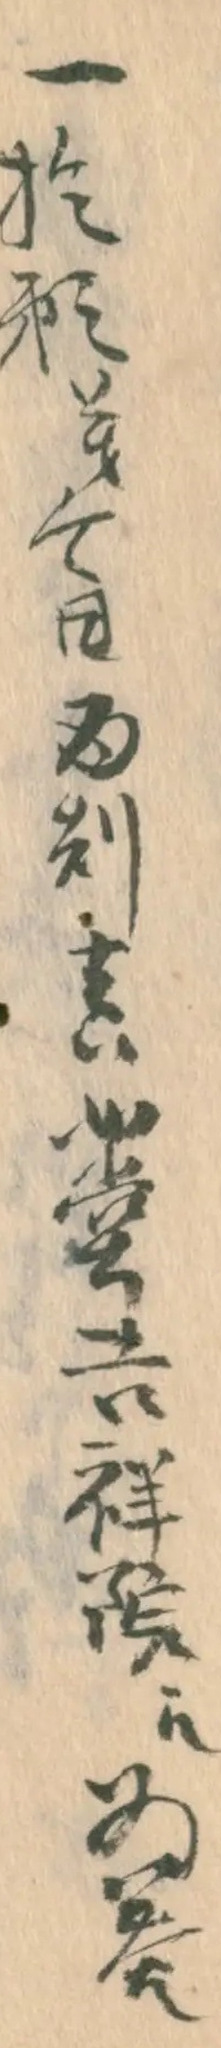一於頼義今日酉刻真如堂吉祥院え為養
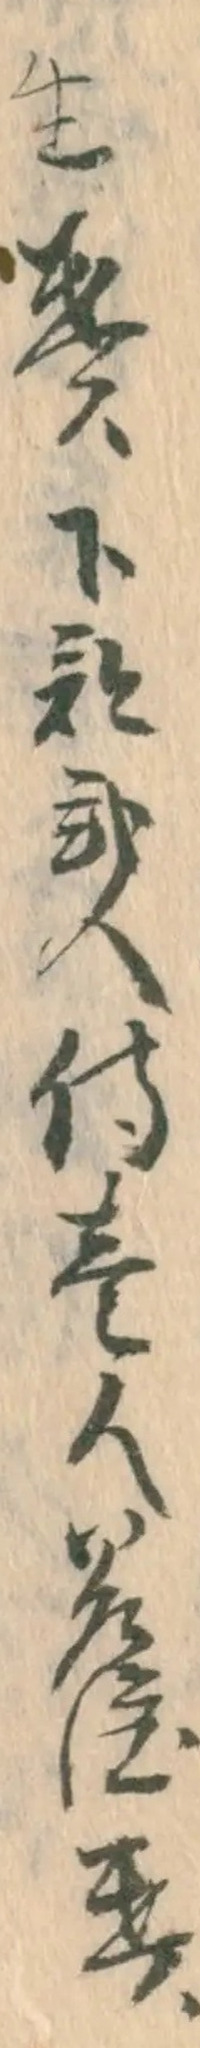生遣ス下部弐人侍壱人差添遣ス
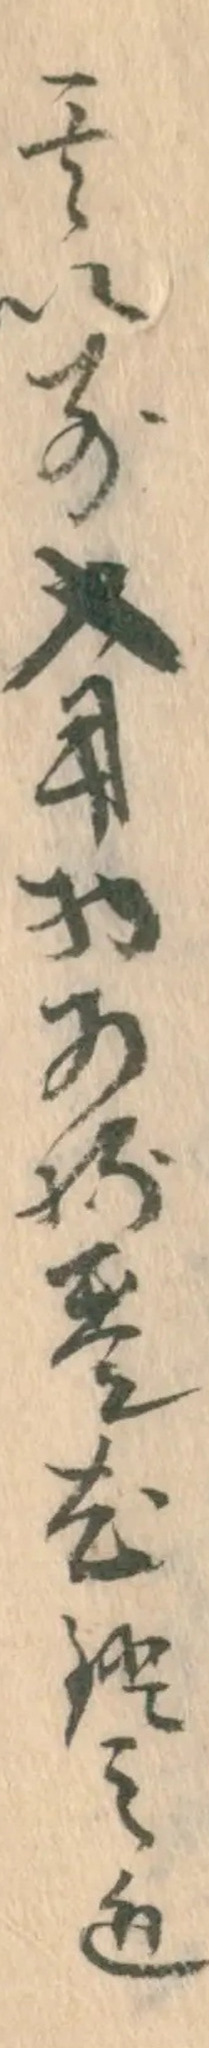其以前入用物為持遣ス尤鐙之進
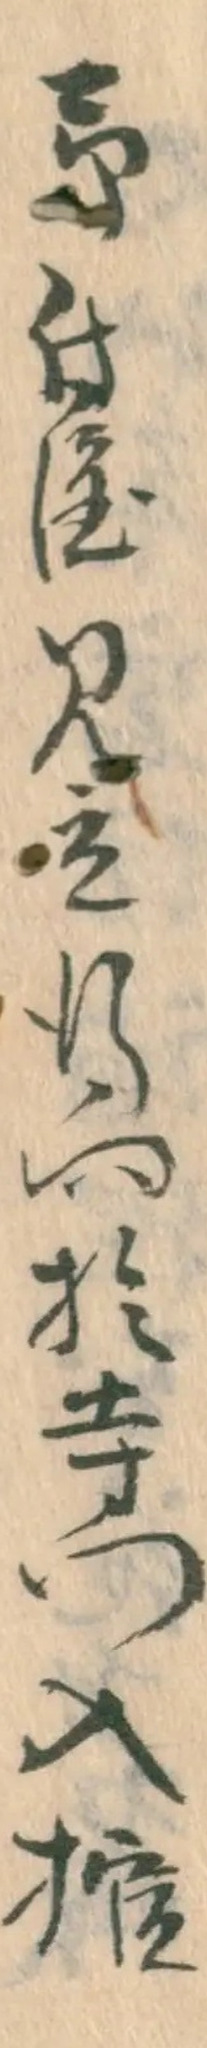予付添見立行向於寺門入棺
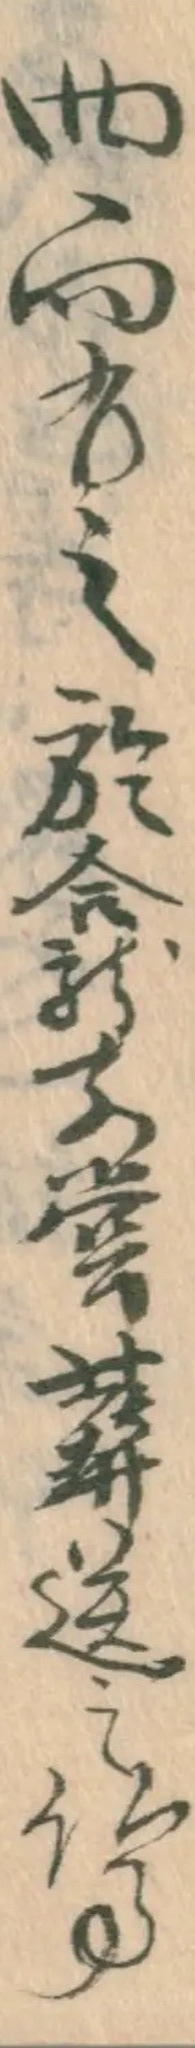回向有之於龕前堂葬送之仏事
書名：禁裏御所御用日記. [131]
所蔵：国立国会図書館 National Diet Library, JAPAN
